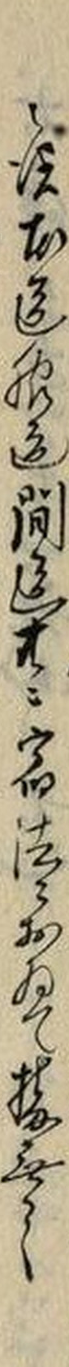候儀本道脇道間道共ニ宿法ニおゐて構無之
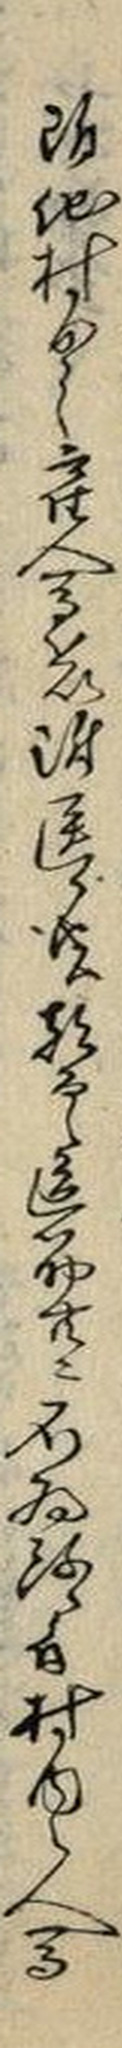附他村ゟ之雇人馬を以附送候儀ハ都而之道筋共ニ不為致候ニ付村内之人馬
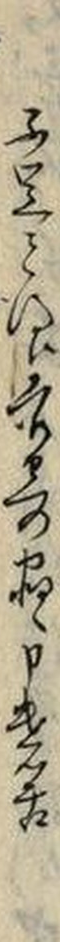不足ニ候得ハ最寄宿へ申遣筈
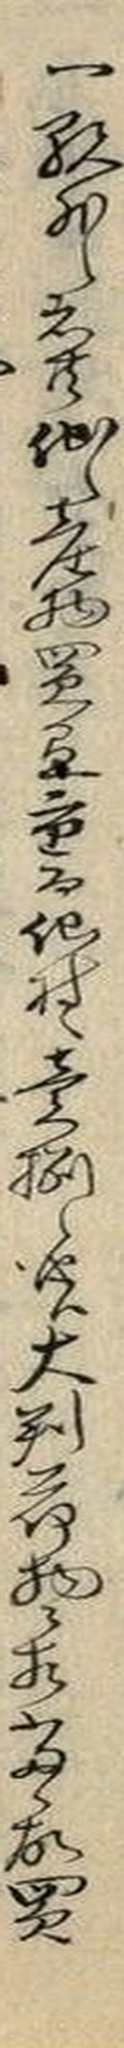一駅外之者共他之産物買置重而他村へ売捌候儀ハ大判荷物ニ相当候故買
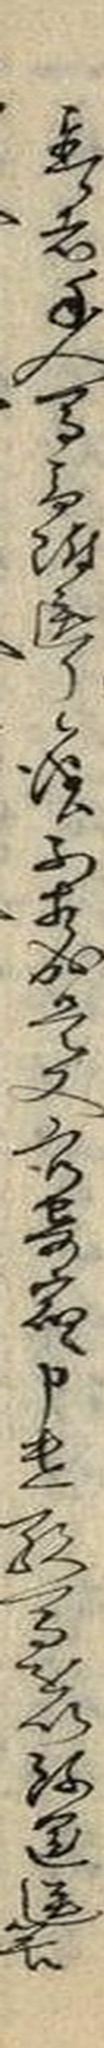置候者手人馬ニ而附送り候儀ハ不相成是又最寄宿へ申遣駅馬を以致運送筈
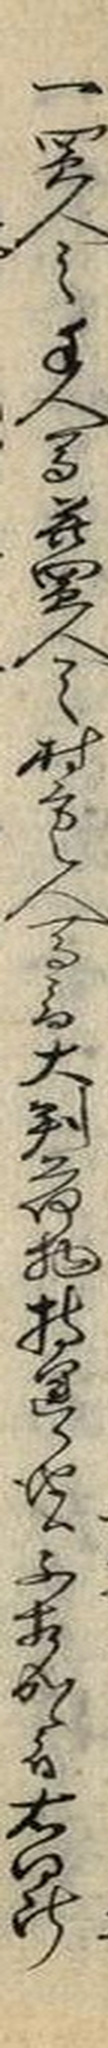一買人之手人馬幷買人之村方之人馬ニ而大判荷物持運候儀ハ不相成候ニ付右同断
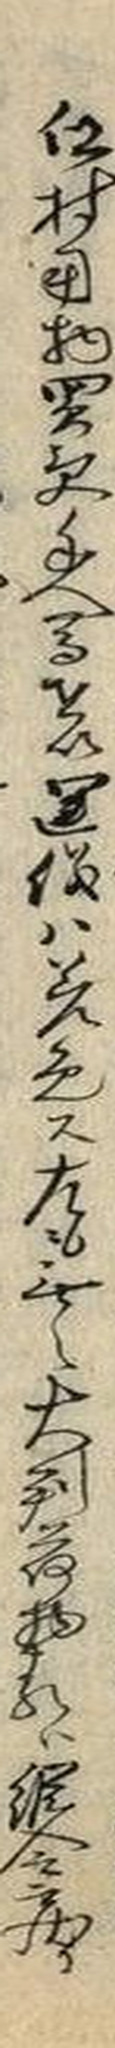但村用物買受手人馬を以運儀ハ差免ス左も無之大判荷物類ハ縦令戻り
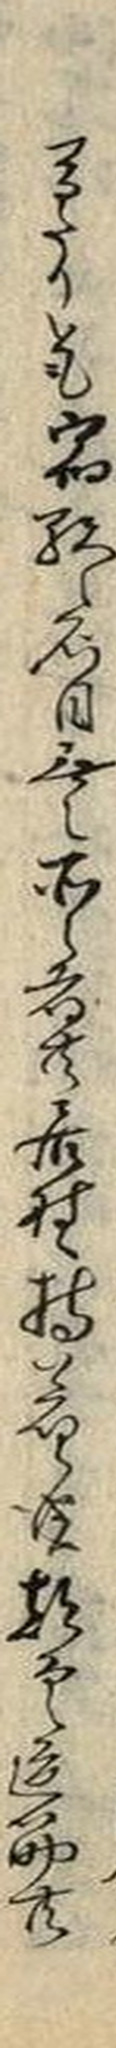馬たりとも宿駅之名目無之所之者共居村へ持着候儀ハ都而之道筋共
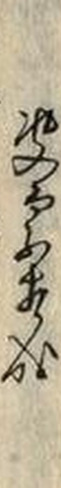決而不相成
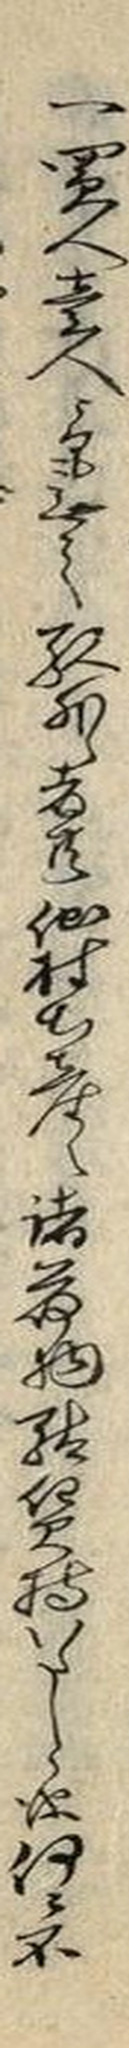一買人売人ニ而も無之駅外之者共他村出産之諸荷物駄賃持いたし候儀何ニ不
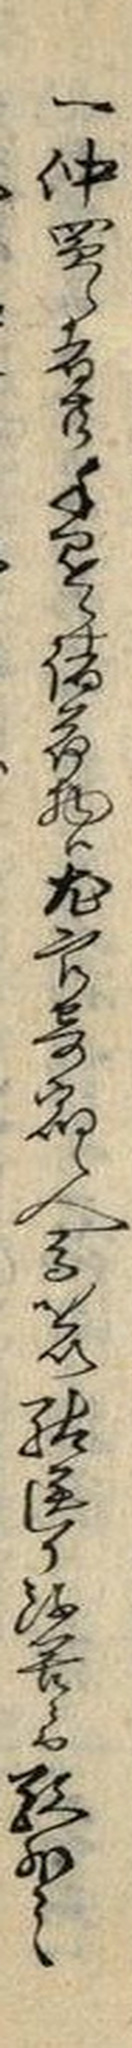一仲買之者共手懸之諸荷物ハ尤最寄宿之人馬を以駄送り致筈ニ而駅外之
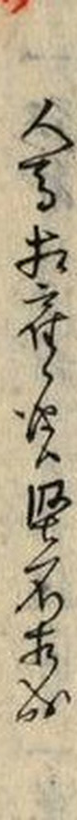人馬相雇候儀ハ堅不相成

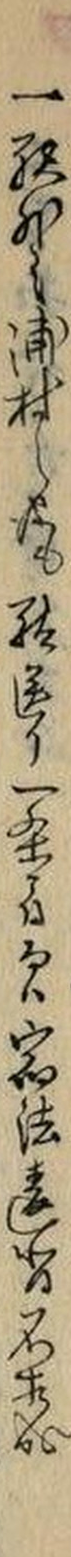一駅外之浦村之儀も駄送り一条ニ付而ハ宿法違背不相成
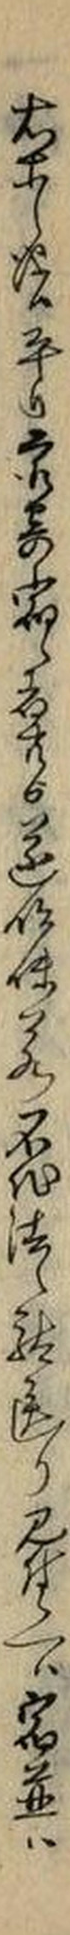右等之儀ハ最寄宿之者共ゟ遂吟味若不作法之駄送り見付候へハ宿並ハ
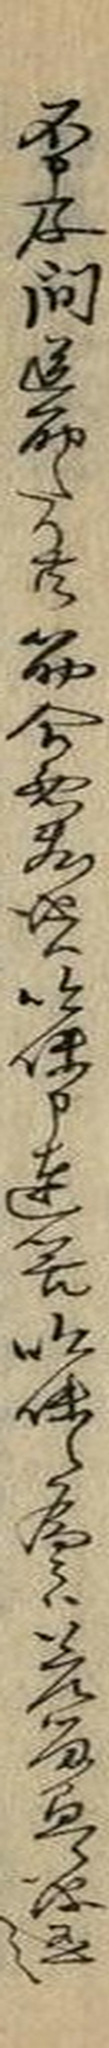不申及間道筋たり共筋合悪敷儀ハ吟味申達筈吟味之為ニハ差留置候儀有之
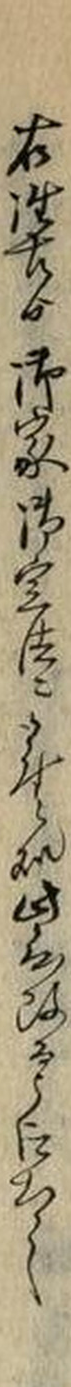右往古ゟ御家御定法ニ御座候処此度改而被仰出之
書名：御国他国諸事之部
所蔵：福井県文書館 Fukui Prefectural Archives
